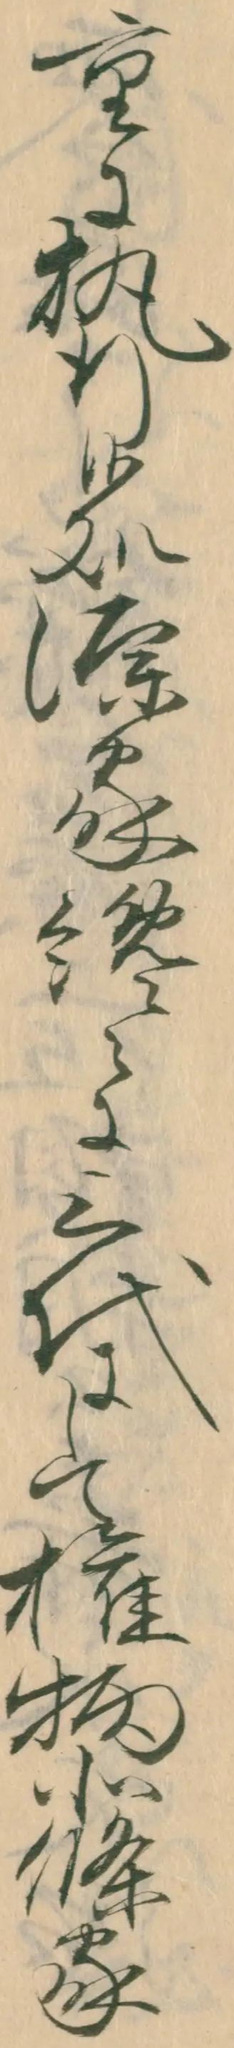重に執行候処源家纔々に三代にして権柄北條家
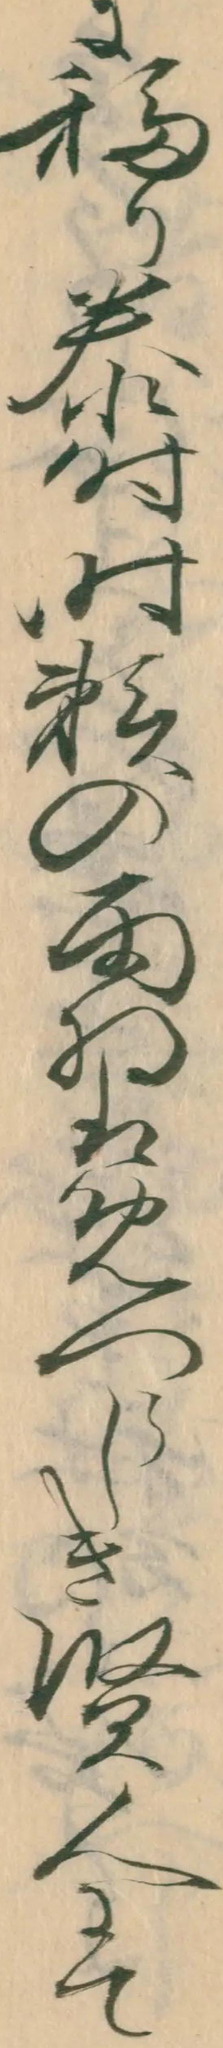に移り泰時時頼の両将はめつらしき賢人にて
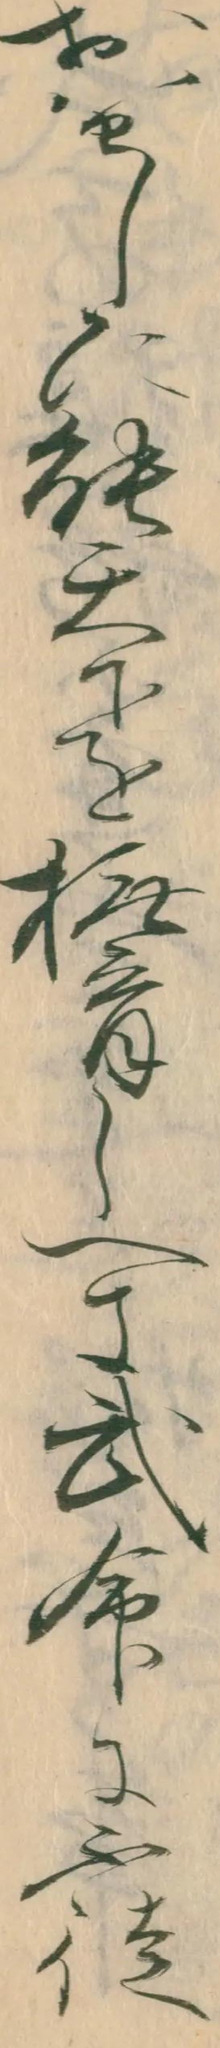おはせしに能天下を撫育しへ武命に不徒
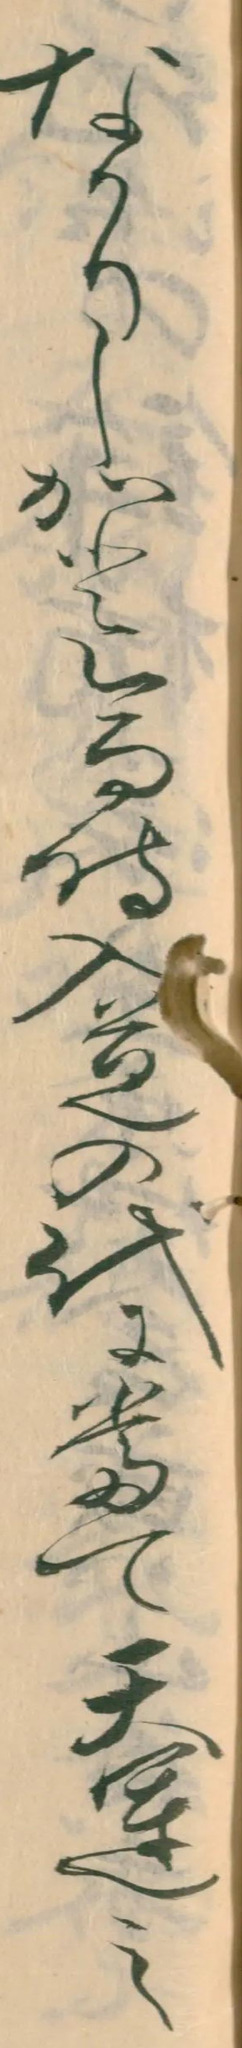なかりしかと今高時入道の代に当て天運之
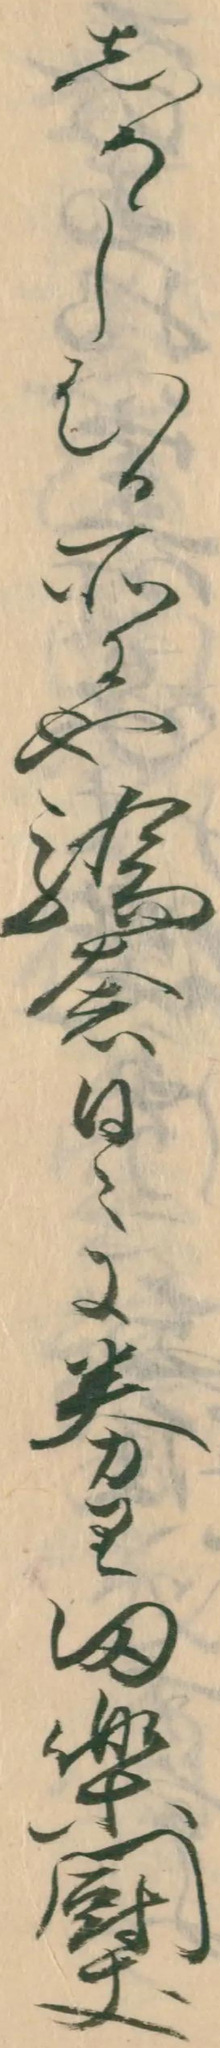しかしむる所にや驕奢日々に券り田楽闘犬
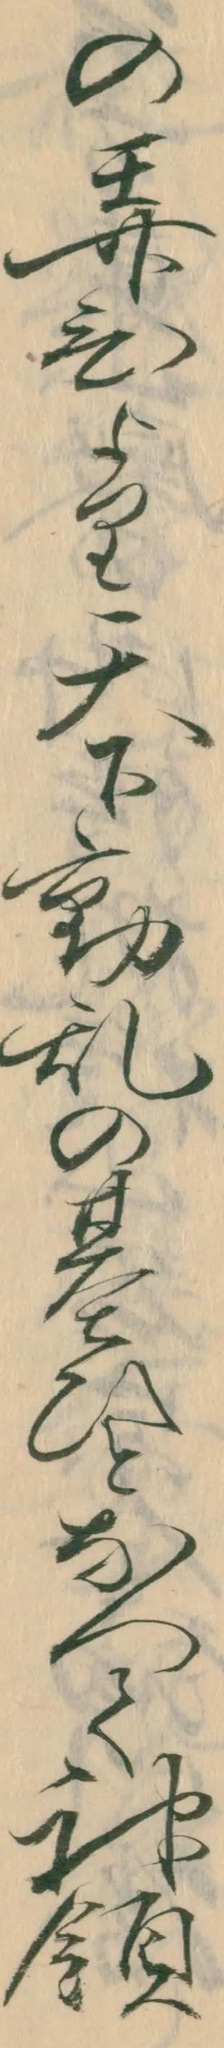の弄ひより天下動乱の基ひとなつて神領
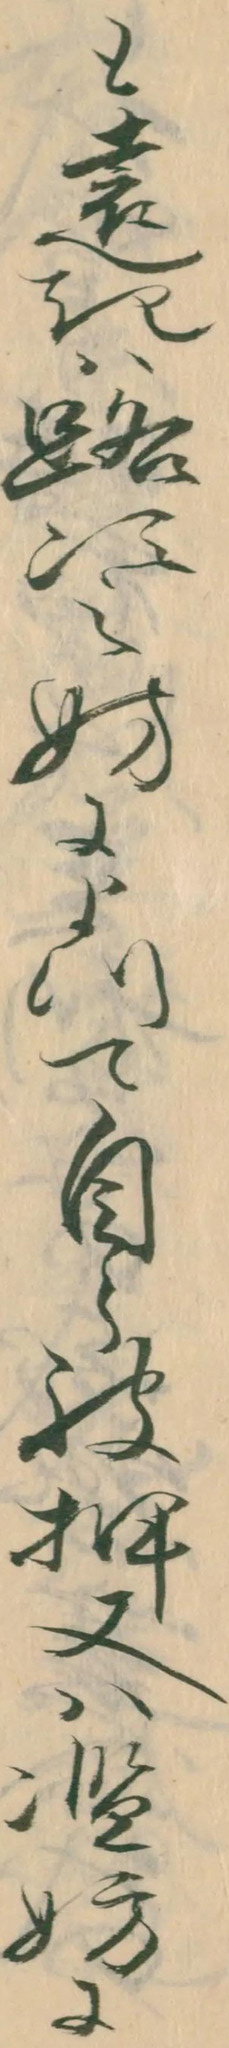も遠きは路次之妨によつて自ら被押又は濫妨に
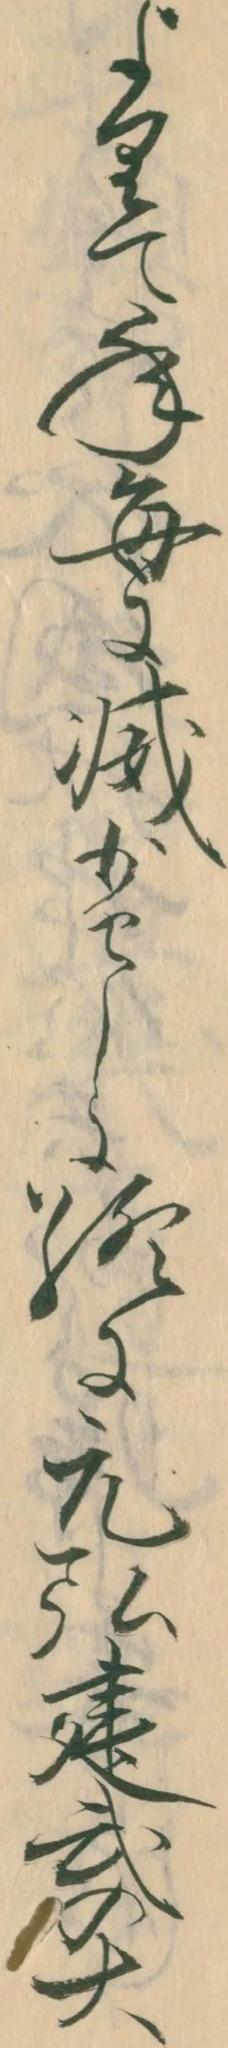よりて年毎に減少せしに終に元弘建武の大
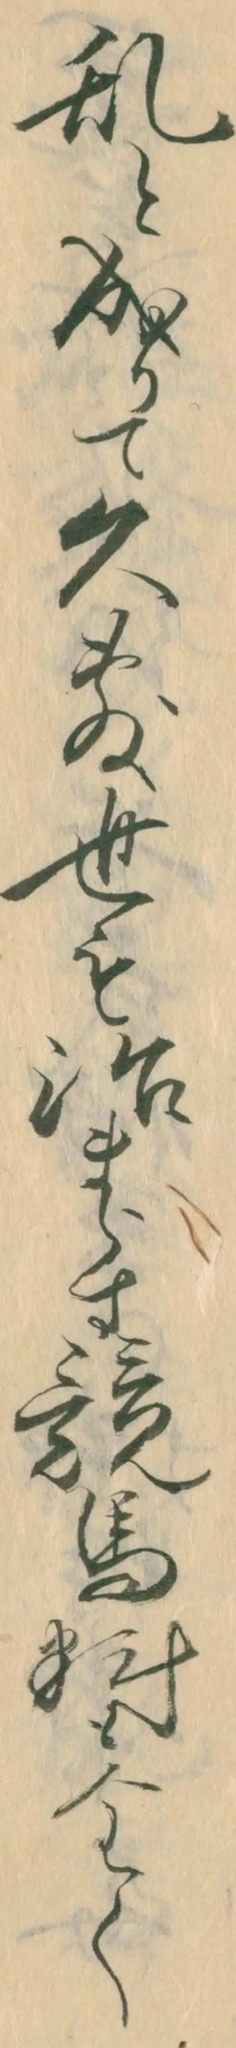乱と成りて久敷世も治まらす競馬料も全く

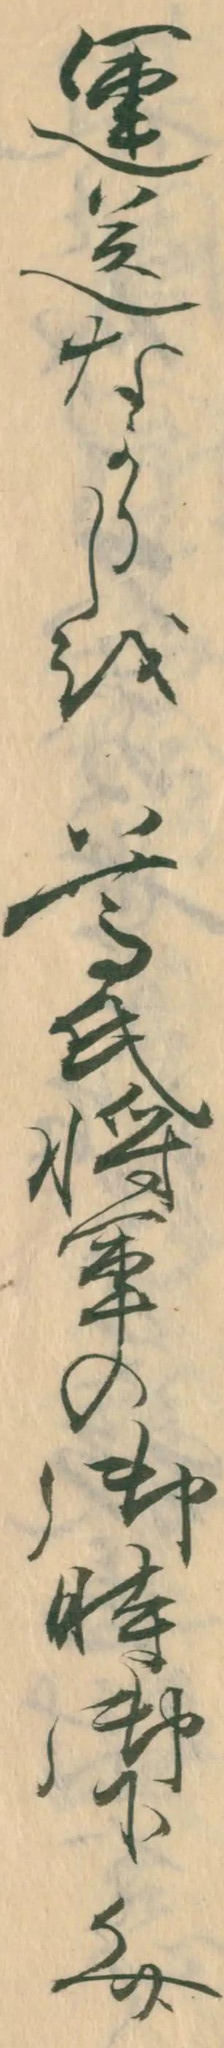運送なかりしを尊氏将軍の御時御下文
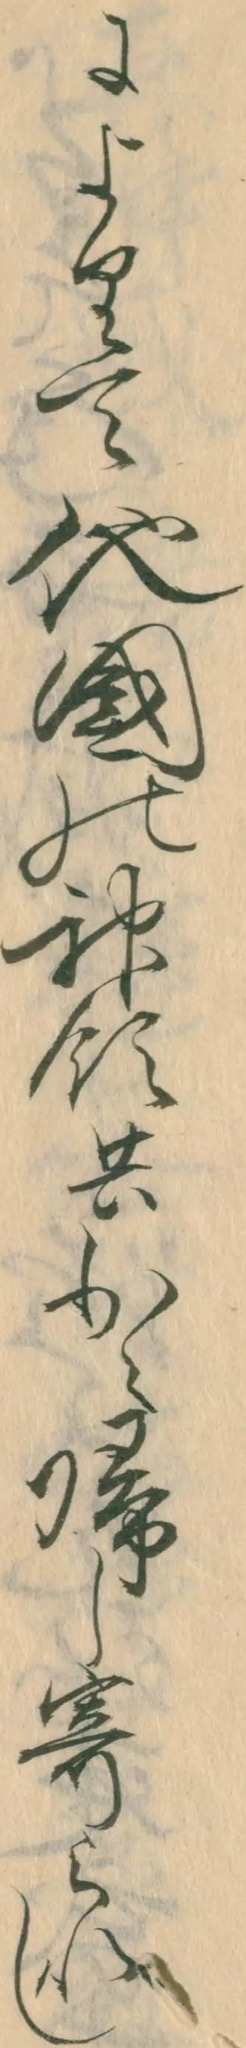によりて他国の神領共少々帰し寄られし
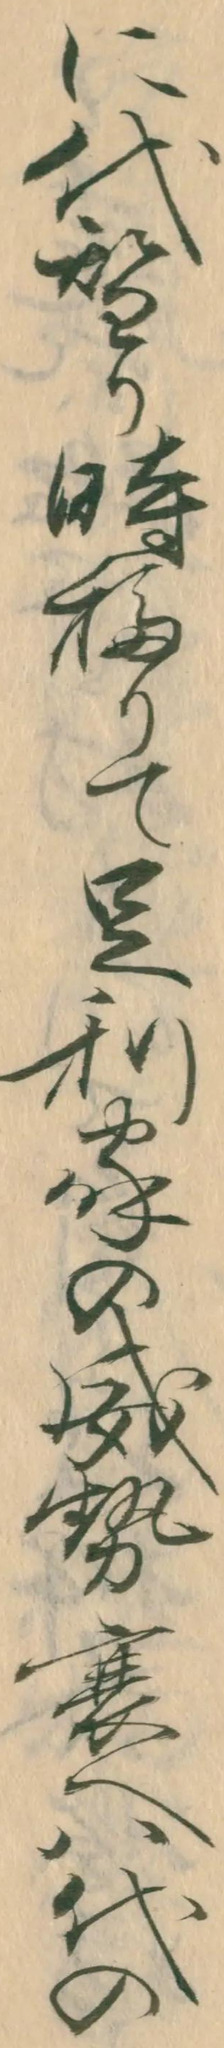に代替り時移りて足利家の威勢衰へ八代の
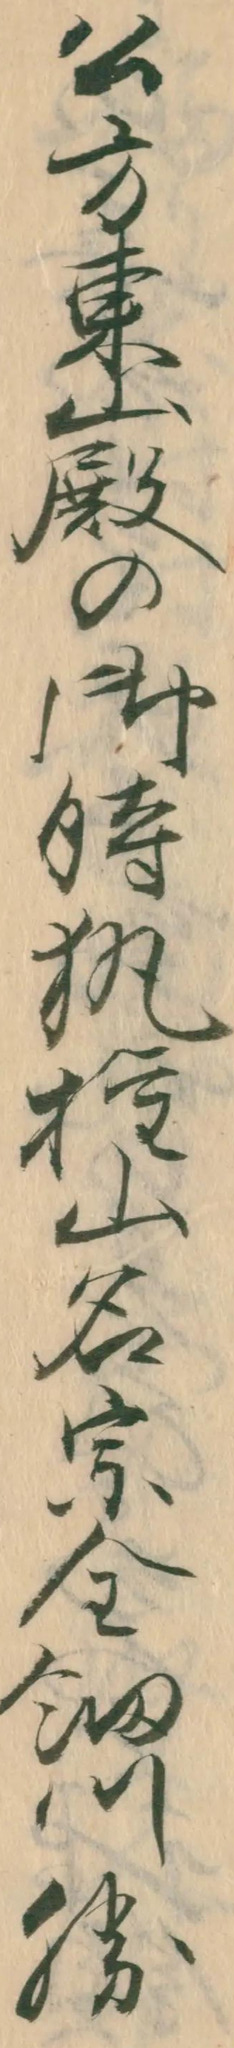公方東山殿の御時執権山名宗全細川勝
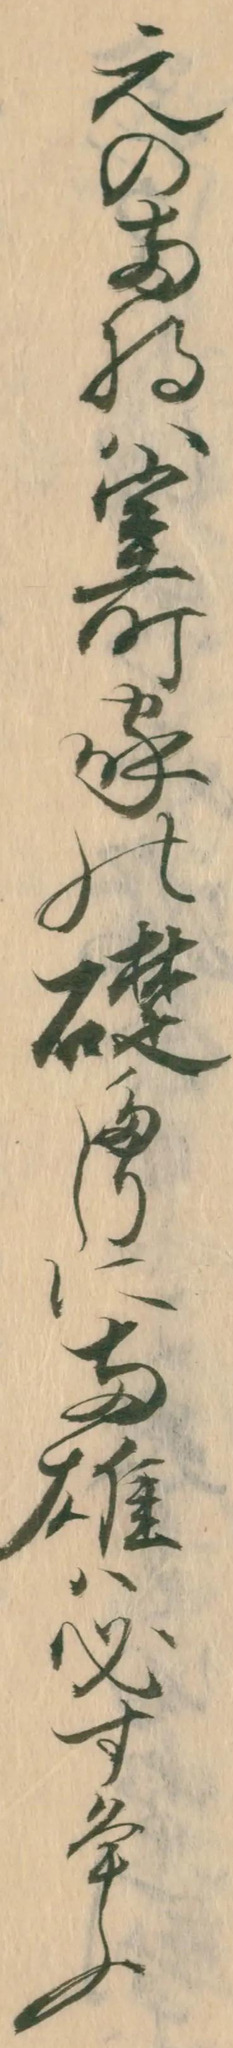元の両将は室町家の礎たりしに両雄は必す争ふ
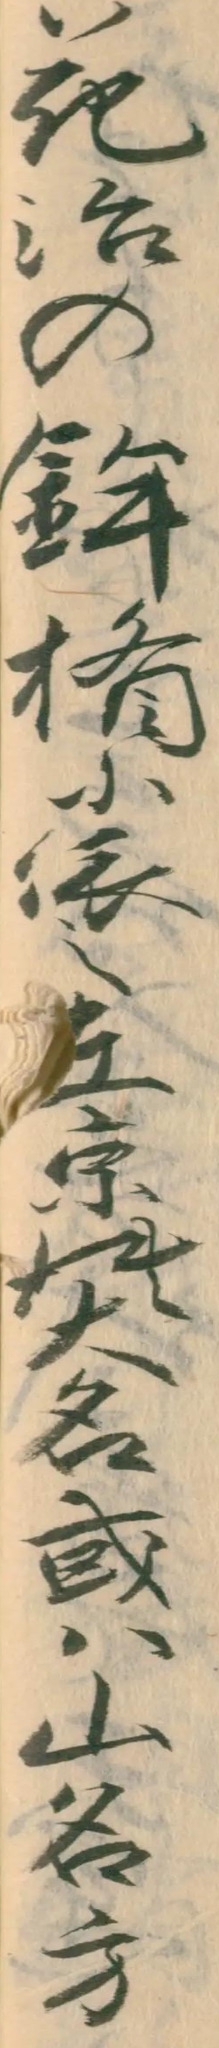花治の鉾楯に依之左京の大名或は山名方
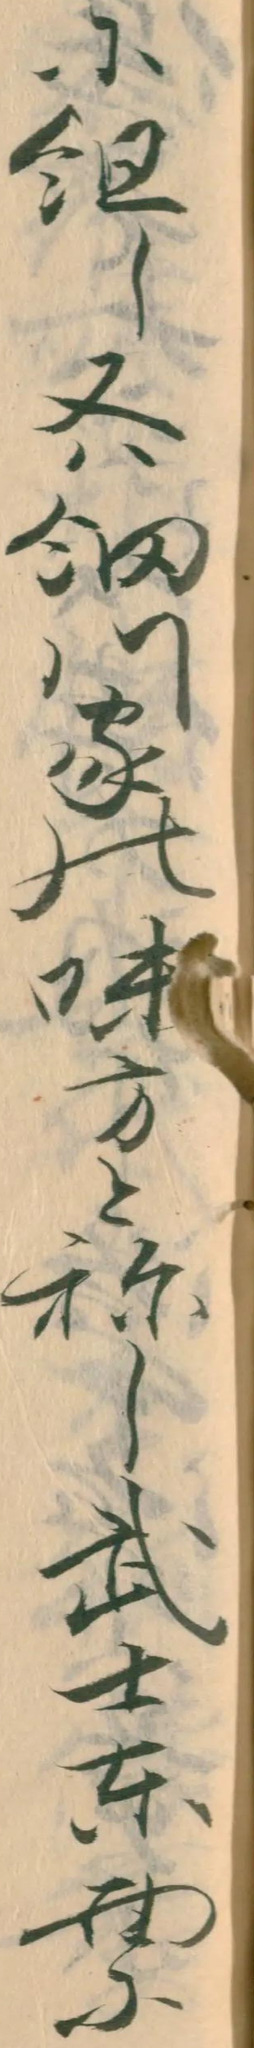に組し又は細川家の味方と称し武士東西に
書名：賀茂社記録. 第12冊
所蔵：国立国会図書館 National Diet Library, JAPAN
